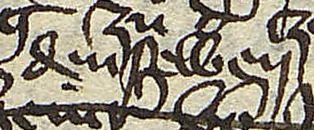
denſelben
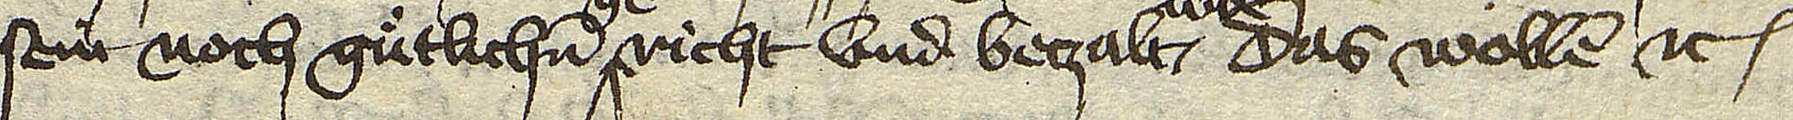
ſein noch gütlichn* richt vnd becʒalt / Das wölle* ec*
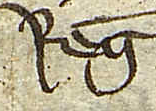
Reg*
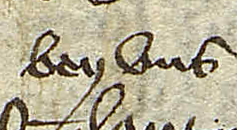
bey vns
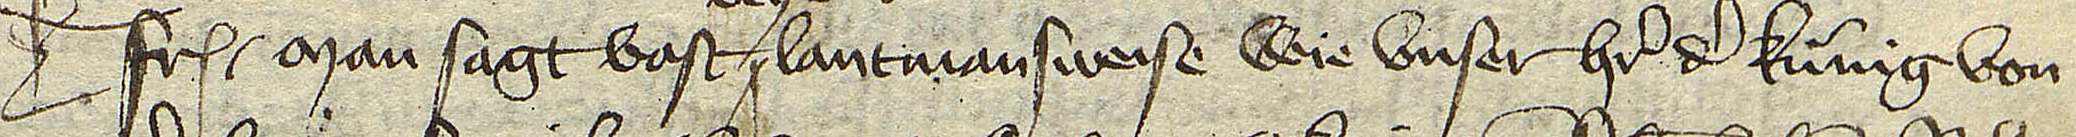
L* fr* / Man ſagt vaſt lantmanſweiſe wie vnſer hr* d* künig von
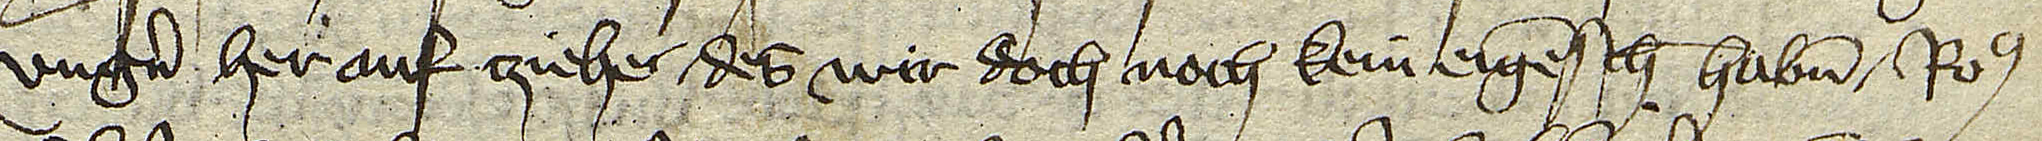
vngn* her auf cʒiehet / des wir doch noch kein eige*ſch* habn* / Ro*
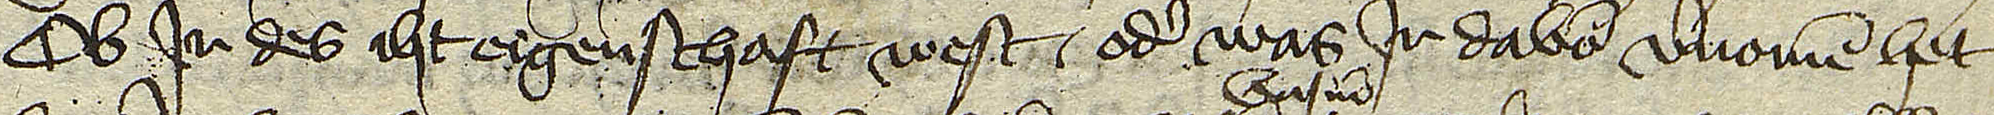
Ob Ir des iht eigenſchaft weſt / od* was Ir davo* v*nome* het
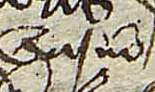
vnſm*
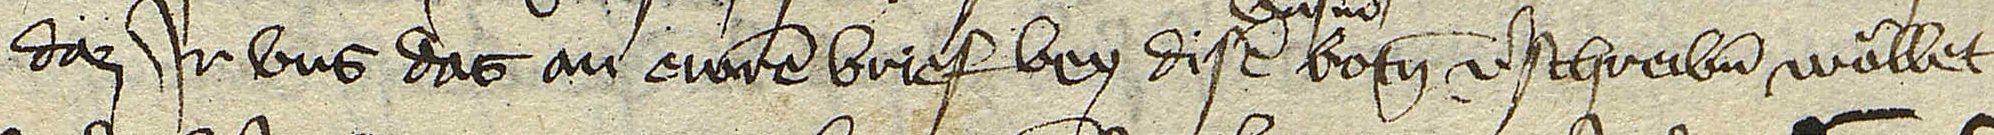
daʒ Ir vns das an ewre* brief bey diſe* botn* v*ſchreibn* wöllet /
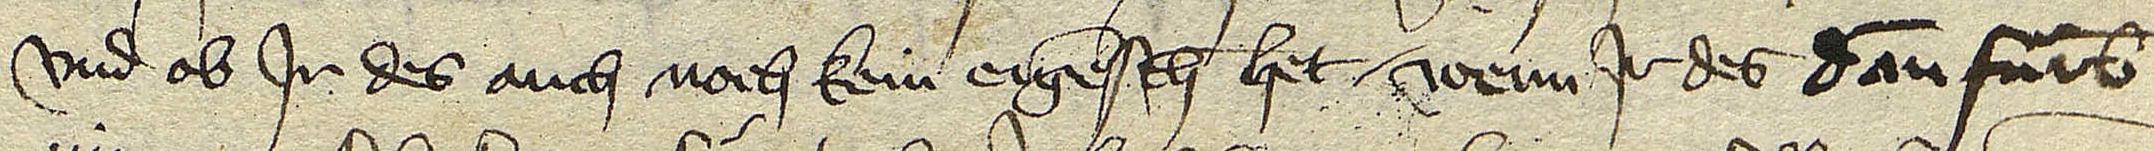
vnd ob Ir des noch kein eige*ſch* het / wenn Ir des dan* fürb*
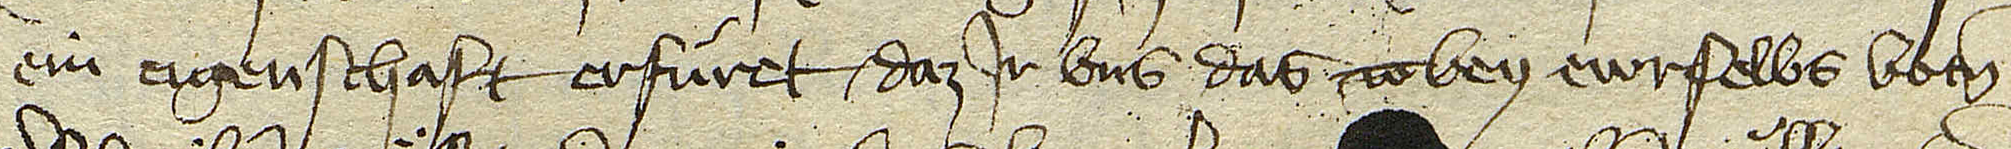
ein eigenſchaft erfüret / daʒ Ir vns das w bey ewrſelbs botn*
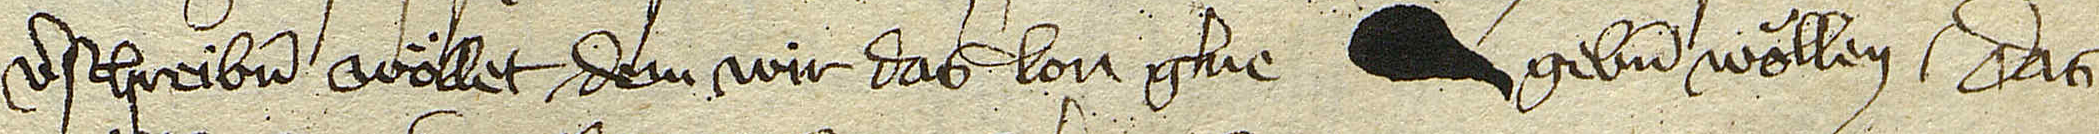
v*ſchreibn* wöllet / dem wir das lon g*ne gebn* wöllen / Das
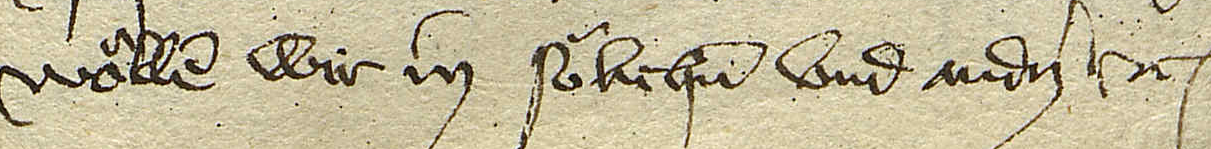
wölle* wir in ſölichn* vnd andn* ec*
